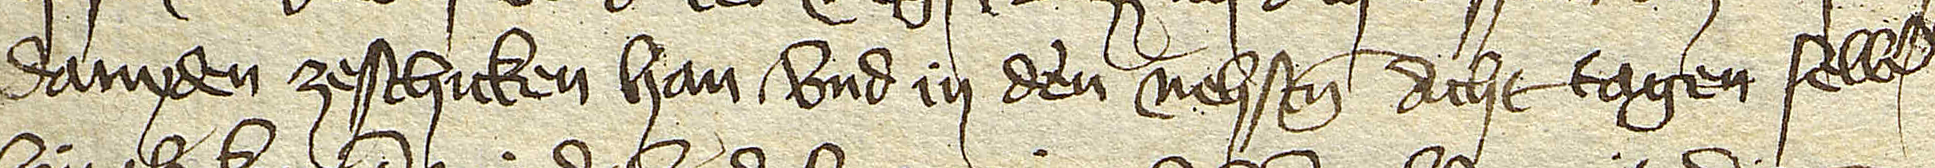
danyden ʒeſchicken han / vnd in den nehſtn* Acht tagen ſelb*
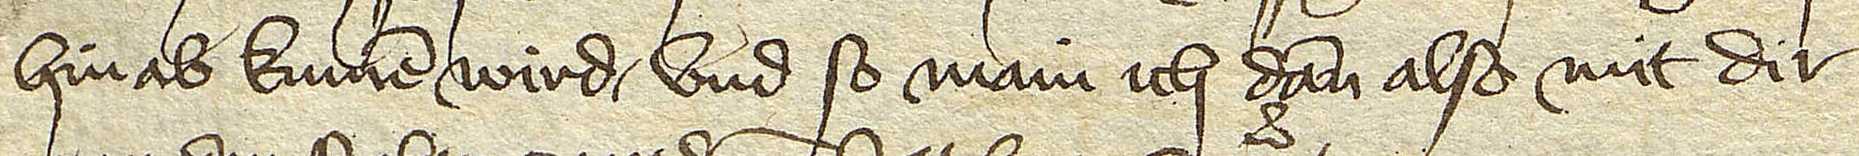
hin ab kume* wird / vnd ſo main ich dan* alſo mit dir
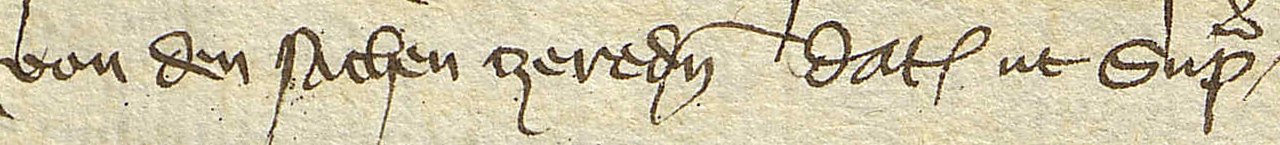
von den ſachen cʒeredn* dat* ut Sup* /
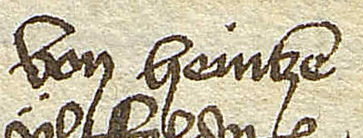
von heintʒe*
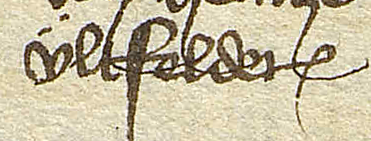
V̈ltfelder*
